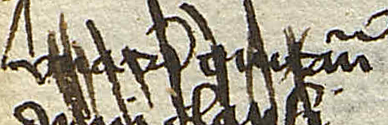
vna %%* %%%%*
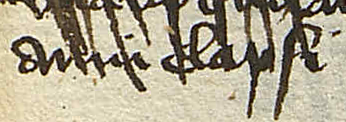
Anni clauſi
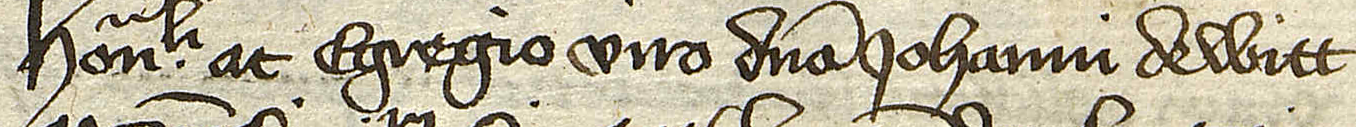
Hon* ac Egregio viro d*no Iohanni Dewitt
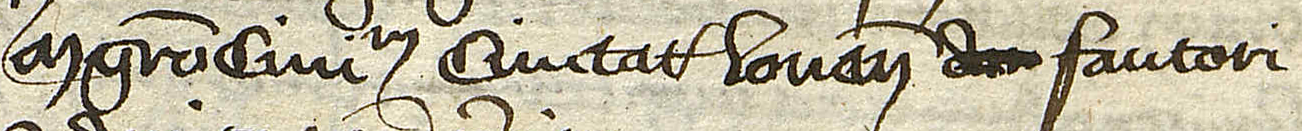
M*gro* Ciui* Ciuitat* Louan* An fautori
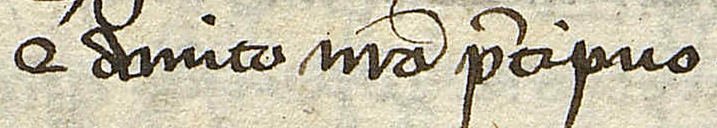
@ Amico n*ro p*cipuo
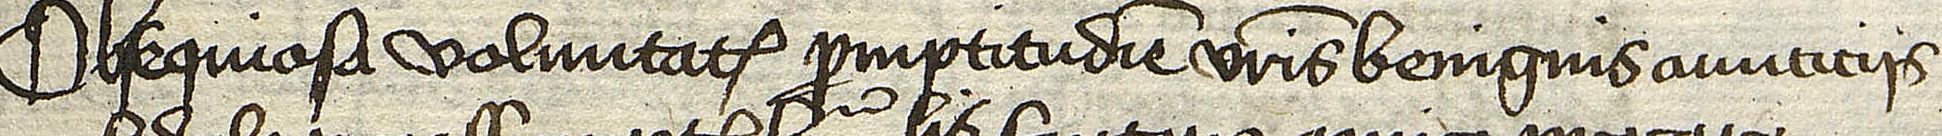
Obſequioſa voluntat* p*mptitudi*e v*ris benignis amiciciis
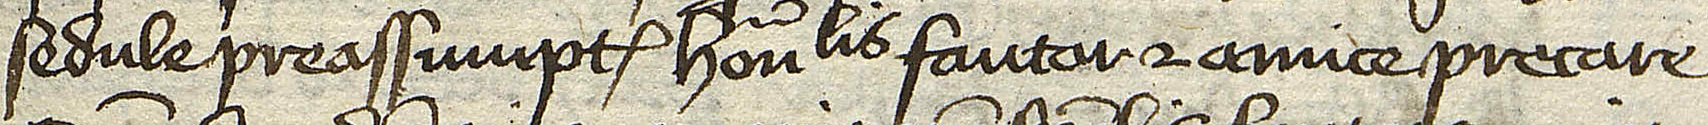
ſedule preaſſumpt* Hon* fautor @ amice precare
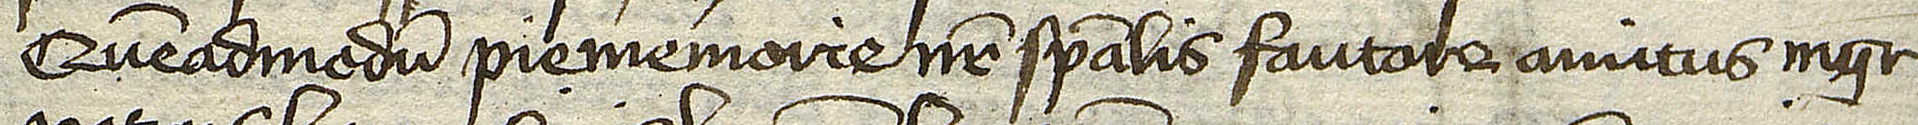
Que*admodu* pie memorie n*r ſp*alis fautore amicus m*g*r
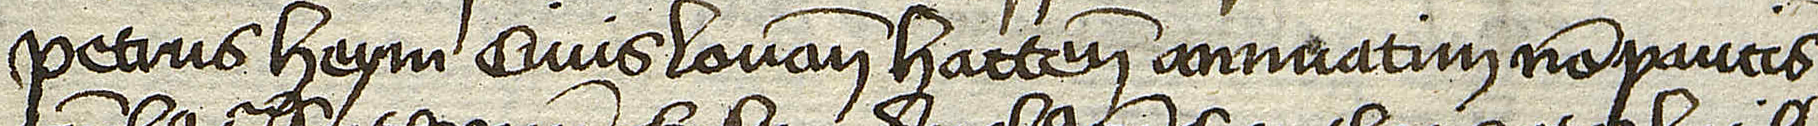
Petrus Heym Ciuis Louan* hacten* annuatim no* paucis
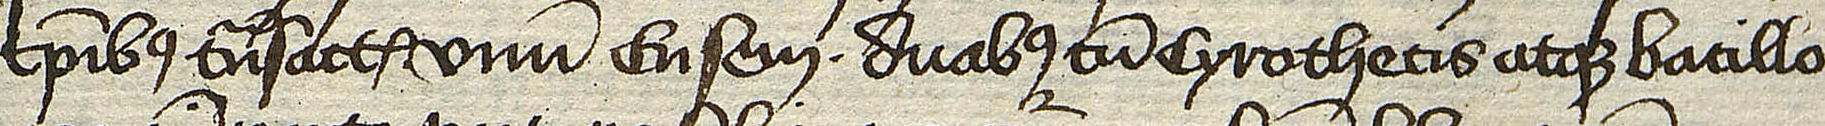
t*p*ib* t*n*fact* v*r*m Enſem . duab* cu* Cyrothecis atq* bacillo
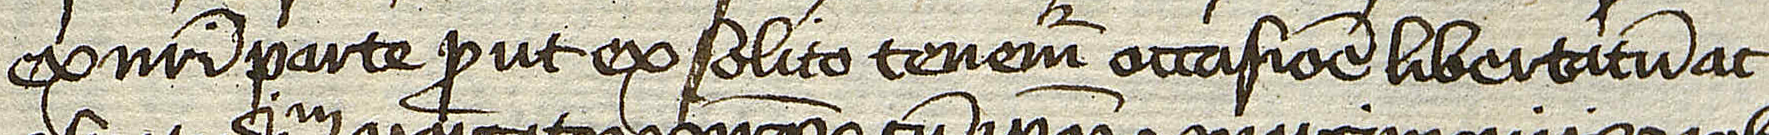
ex n*ri parte p*ut ex ſolito tenem* occaſio*e libertatu* ac
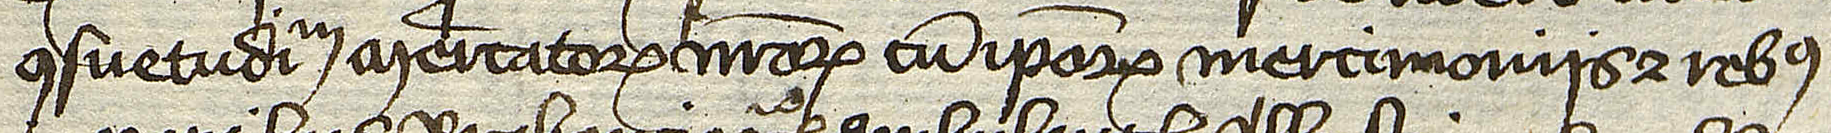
*ſuetudi* Mercato* n*ro* cu* ip*o* mercimoniis @ reb*
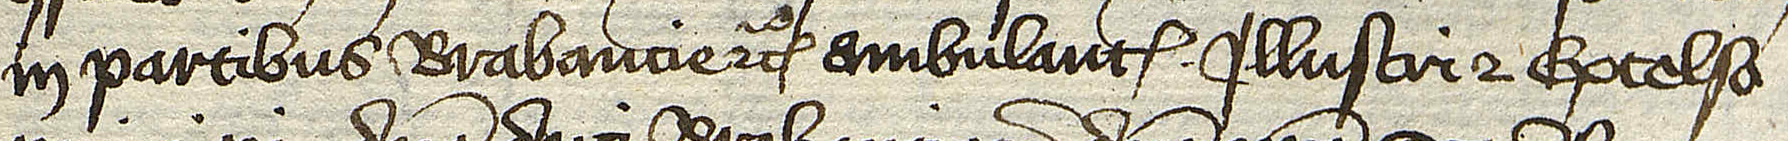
in partibus Brabantie ec* Ambulant* . Illuſtri @ Excelſo
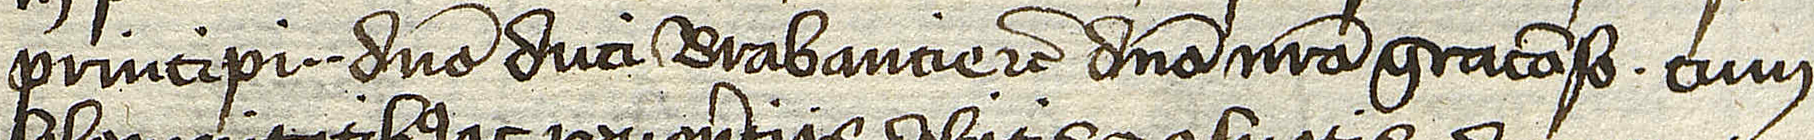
principi ~ d*no duci Brabantie ec* d*no n*ro grac*oſo . cum
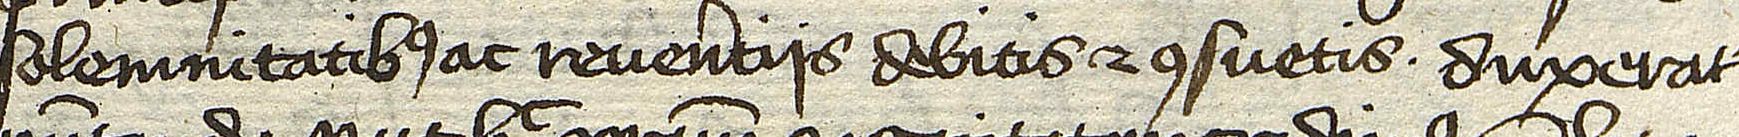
ſolemnitatib* ac reue*ntiis debitis @ *ſuetis . duxerat
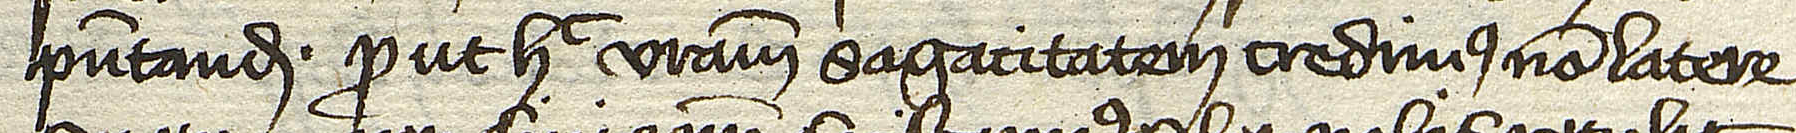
p*ntand* . P*ut h* v*ram Sagacitatem credim* no* latere
